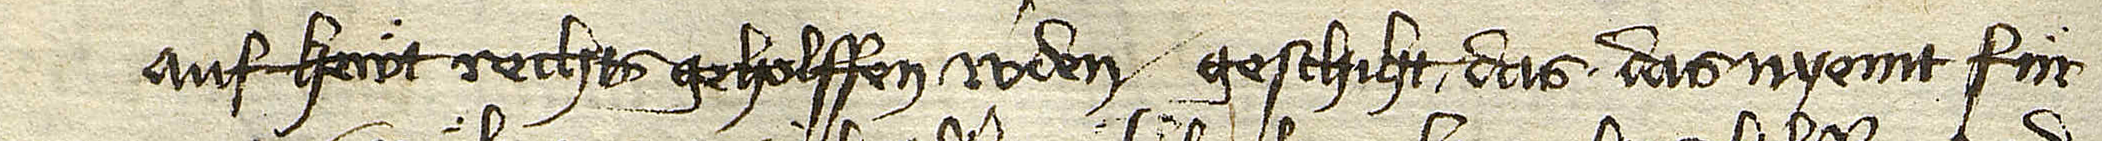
auf hewt rechts geholffen w*den / geſchiht / das . das nyemt für
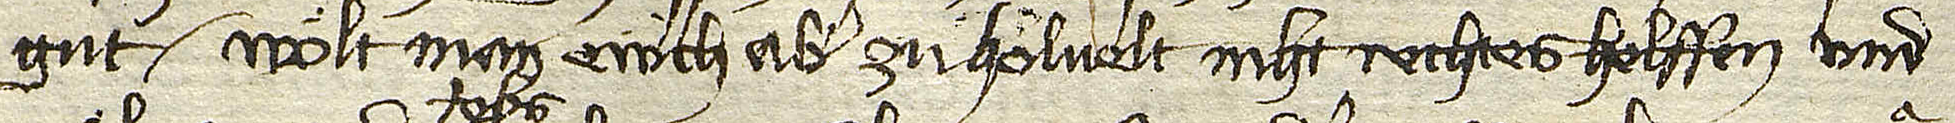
gut / wölt man ewch ab* ʒu höluelt niht rechtes helffen vnd
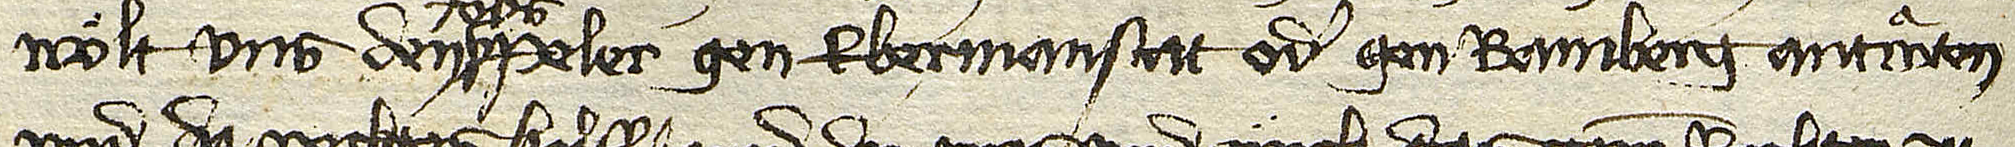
wölt vns denſ* Peler gen Ebermanſtat od* gen Bamberg antw*ten
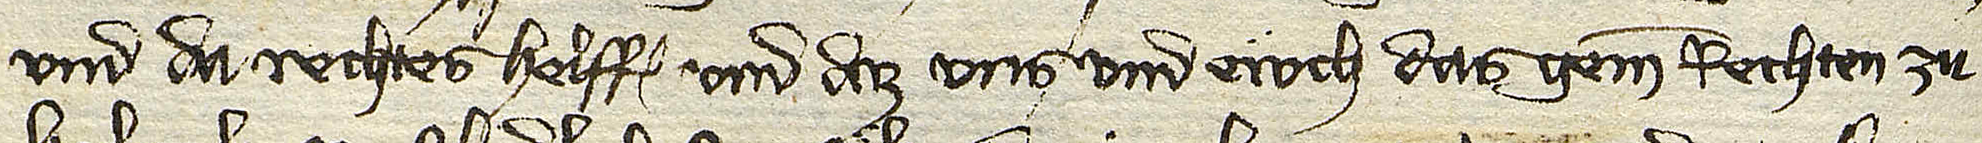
vnd da rechtes helff* vnd daʒ vns vnd ewch das gem* Rechten ʒu
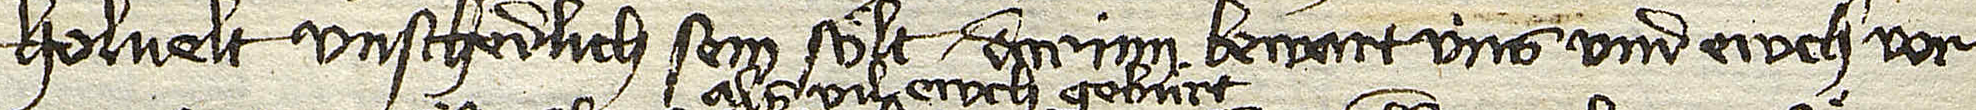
Holuelt vnſchedlich ſein ſölt / darinn . bewart vns vnd ewch vor
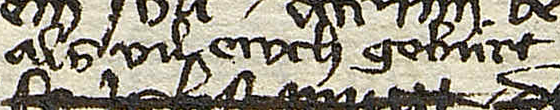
als vil ewch gebürt
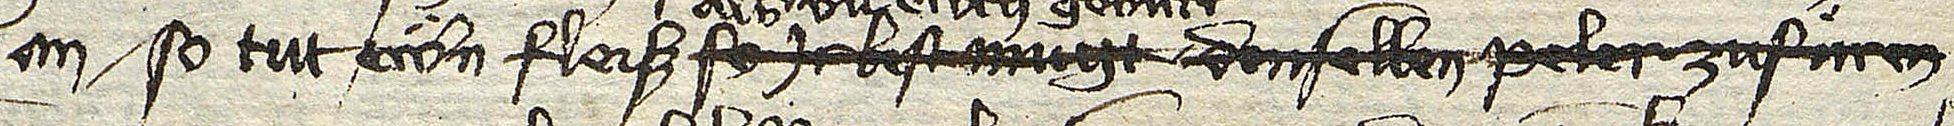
an / ſo tut ewr*n fleiſʒ ſo Ir beſt mugt / denſelben Peler ʒufüren
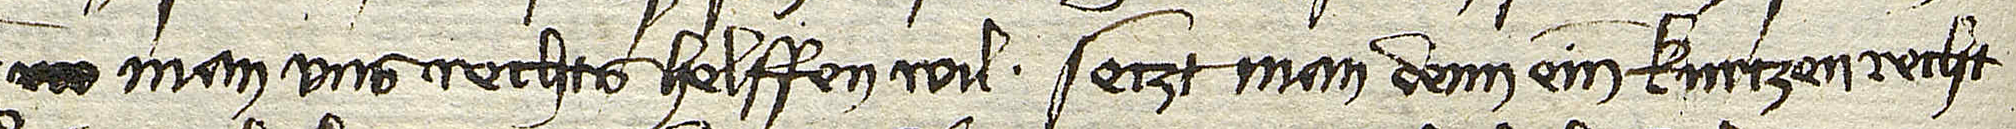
wo man vns rechts helffen wil . ſecʒt man denn ein* kurʒen recht
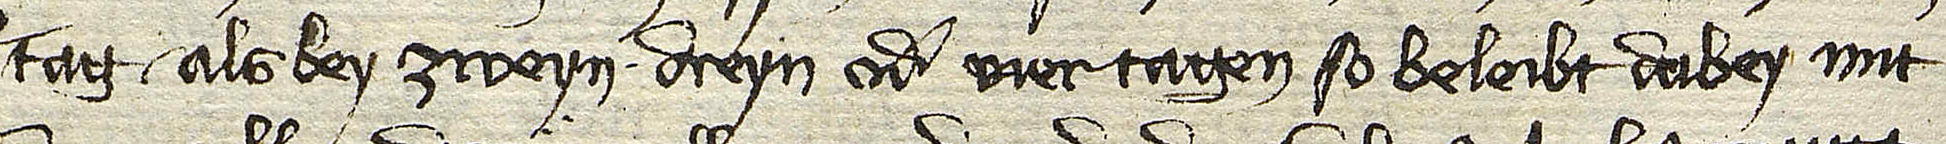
tag / als bey ʒweyn . dreyn od* vier tagen ſo beleibt dabey mit
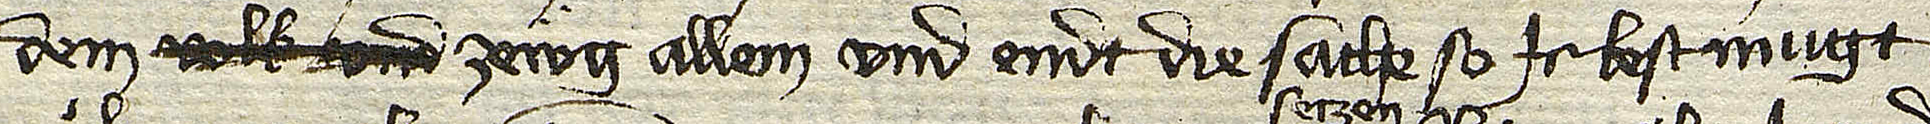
dem volk / vnd ʒewg allein vnd endt die ſache ſo Ir beſt mugt
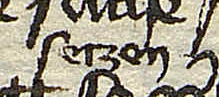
ſecʒen
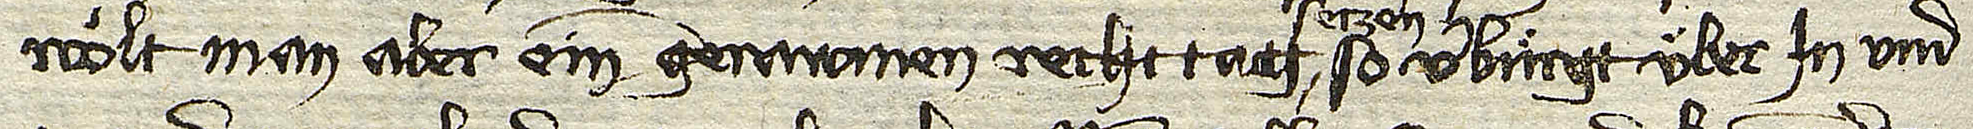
wölt man aber ein* gerawmen recht tag / ſo v* bürgt v̈ber In vnd
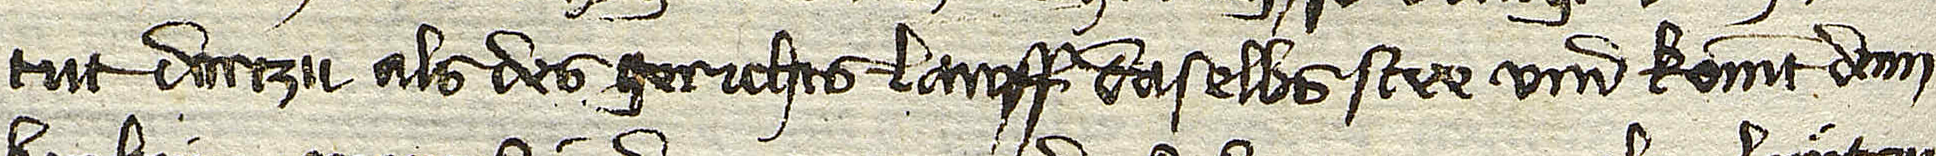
tut darcʒu als des gerichts Lawff daſelbsſtee vnd ko*mt denn
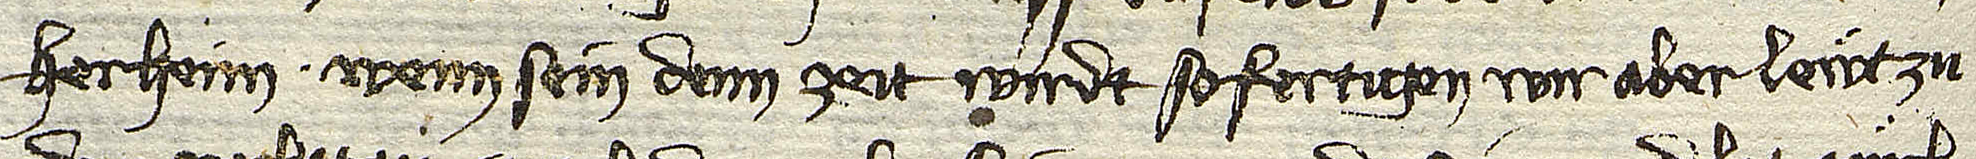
herheim . wenn ſein denn ʒeit wirdt ſo fertigen wir aber lewt ʒu
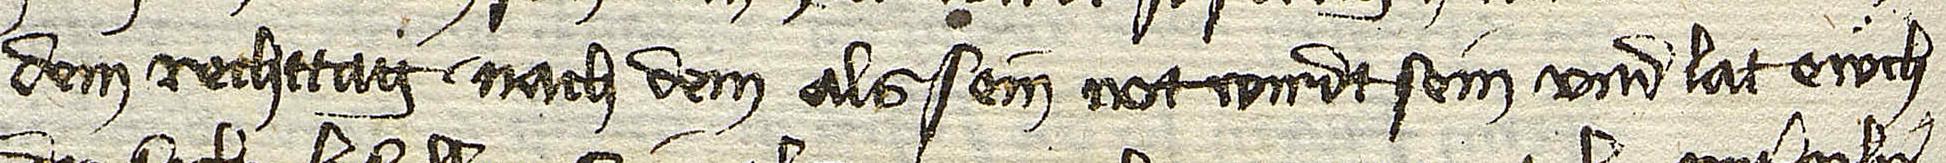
dem rechttag / nach dem als ſein not wirdt ſein vnd lat ewch
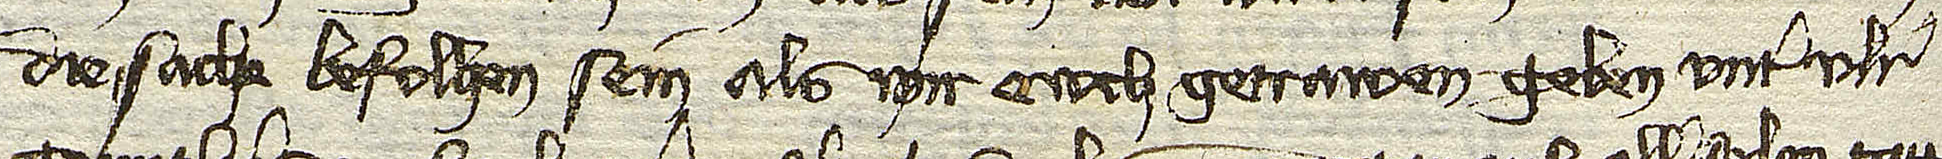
die ſache befolhen ſein als wir ewch getrawen . geben vnt* vlr*
